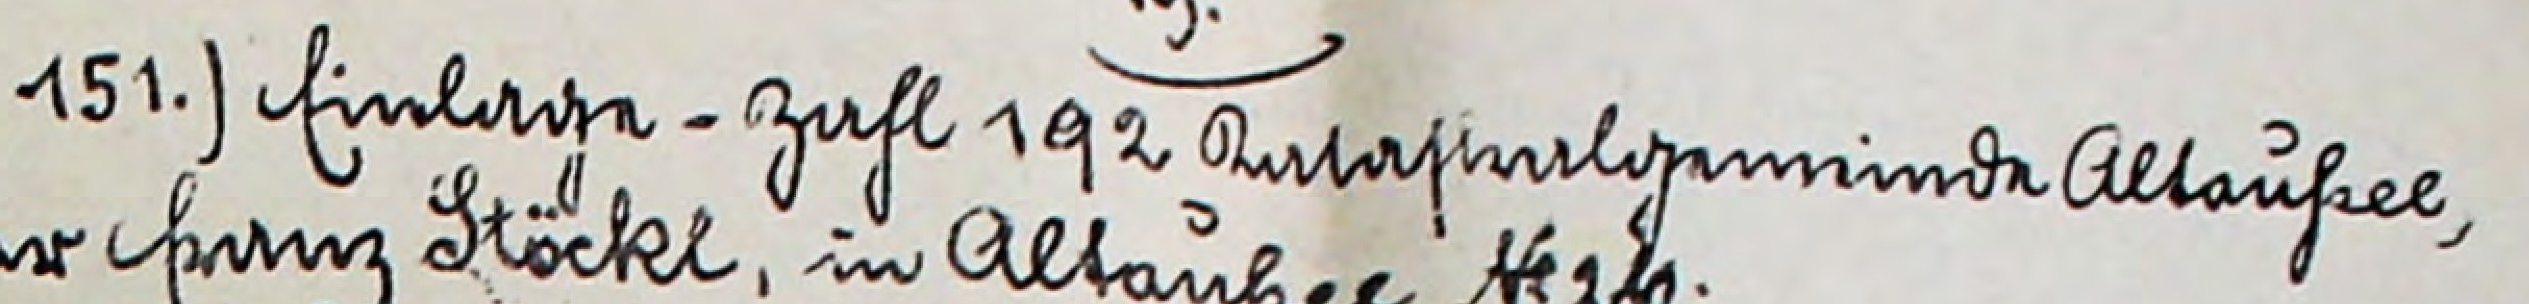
151.) Einlage - Zahl 192 Katastralgemeinde Altaussee,
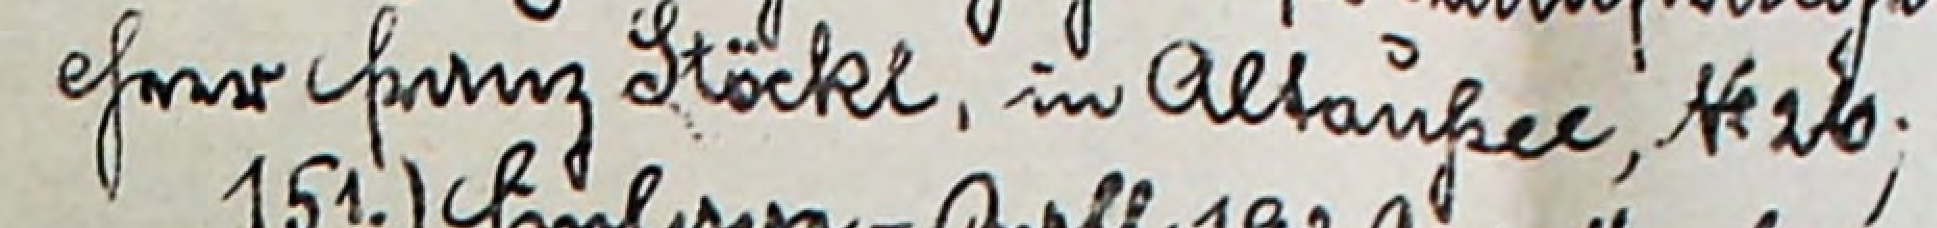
Herr Franz Stöckl, in Altaussee, № 26;
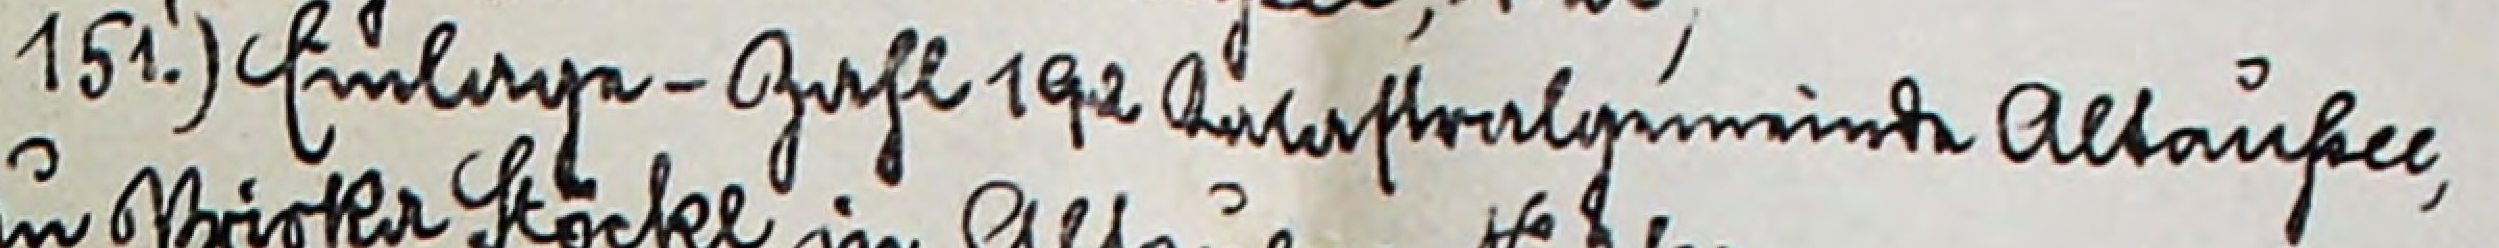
151.) Einlage - Zahl 192 Katastralgemeinde Altaussee,
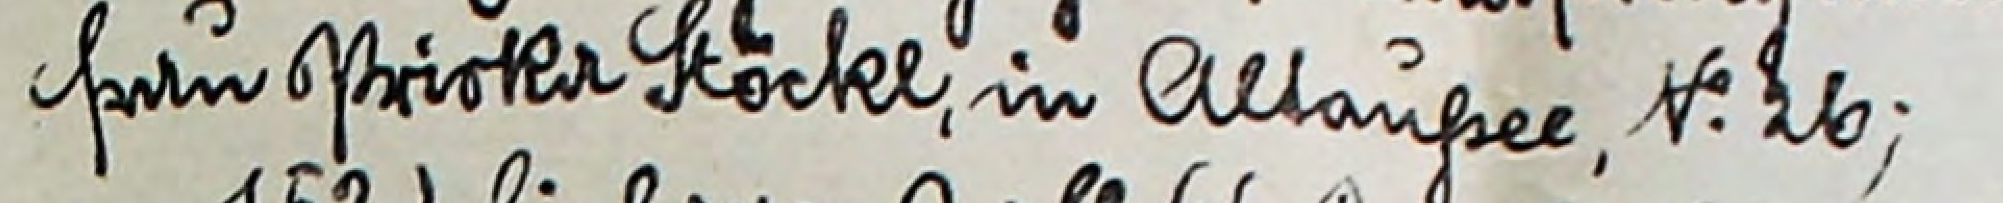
Frau Priska Stöckl, in Altaussee, № 26;
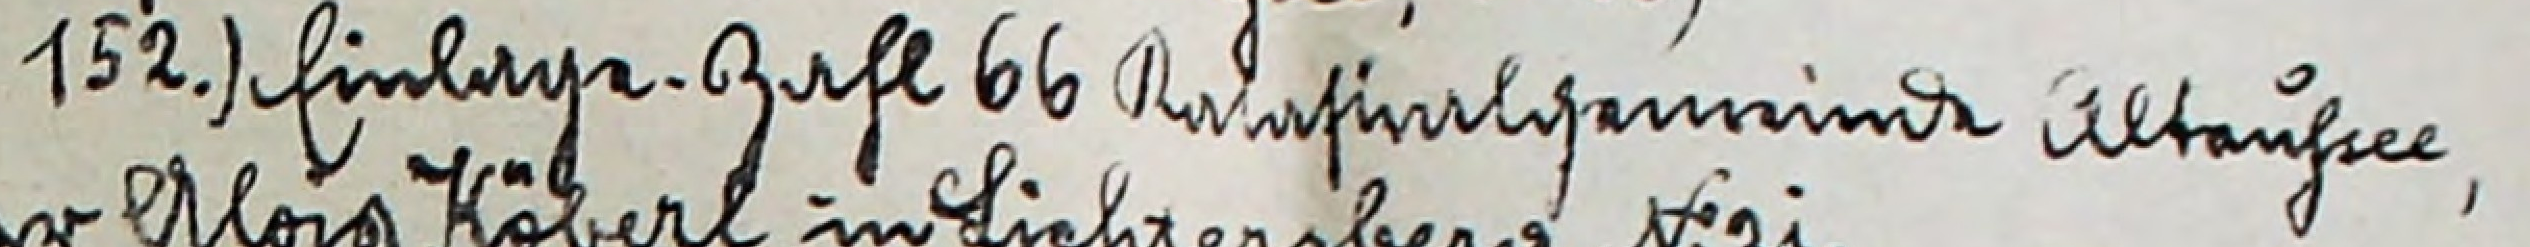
152.) Einlage - Zahl 66 Katastralgemeinde Altaussee,
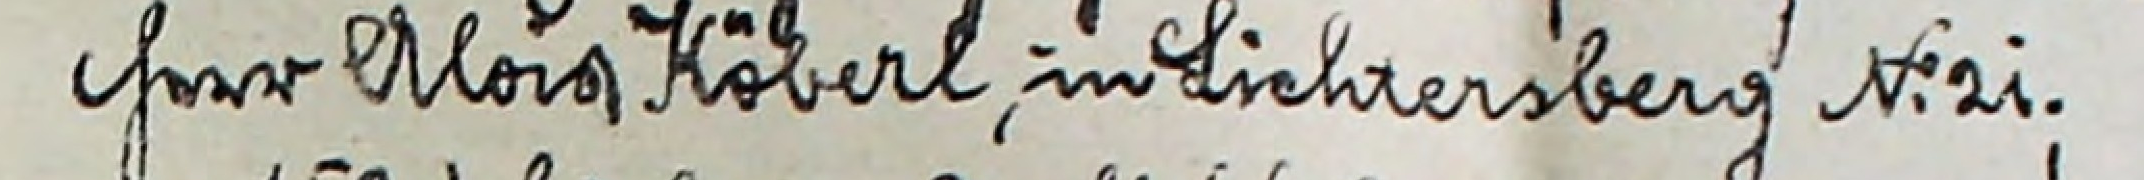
Herr Alois Köberl, in Lichtersberg № 21;
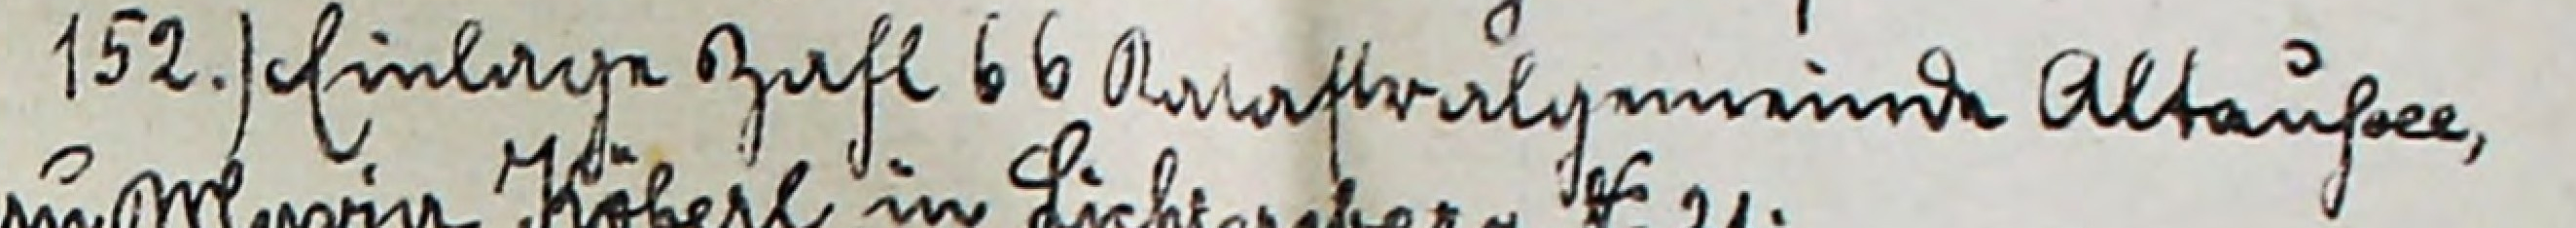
152.) Einlage Zahl 66 Katastralgemeinde Altaussee,
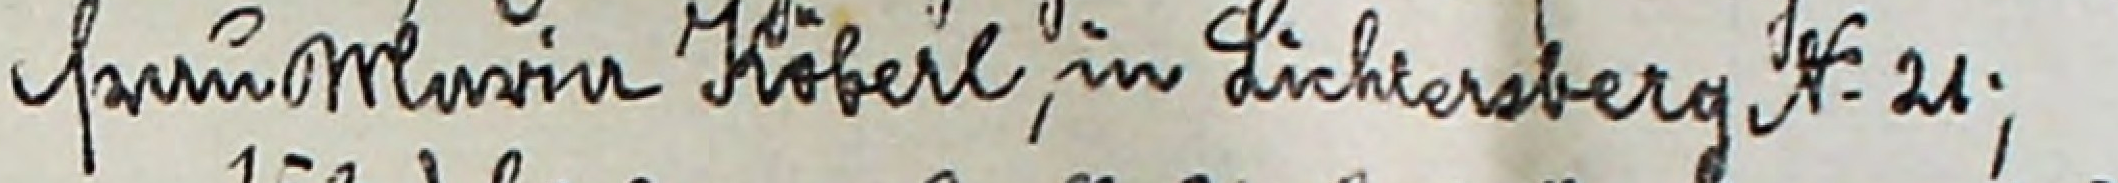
Frau Maria Köberl, in Lichtersberg № 21;
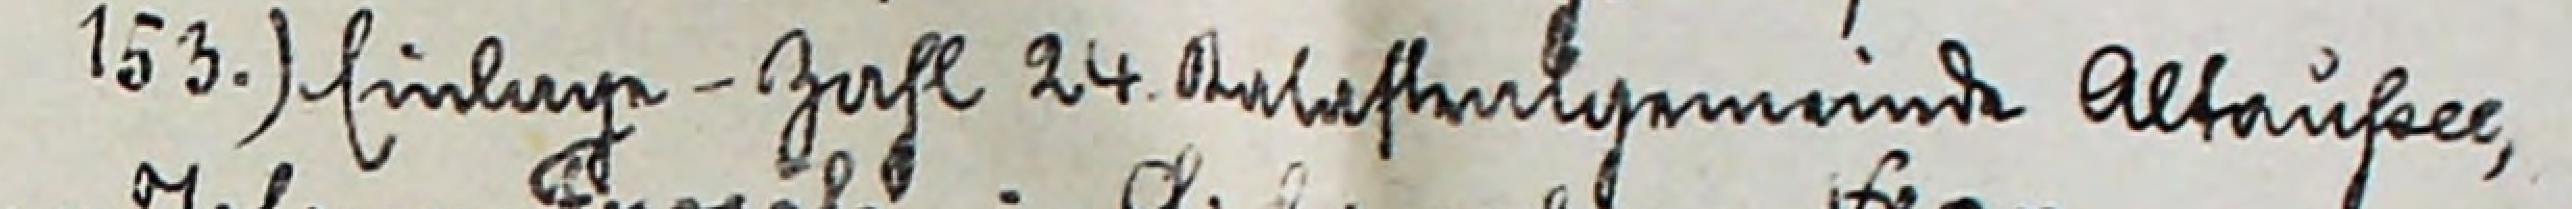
153.) Einlage - Zahl 24. Katastralgemeinde Altaussee,
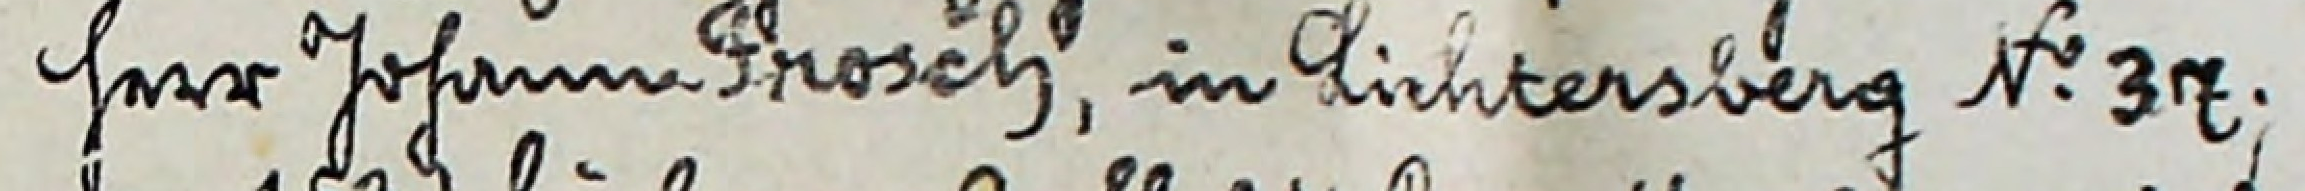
Herr Johann Frosch, in Lichtersberg № 37;
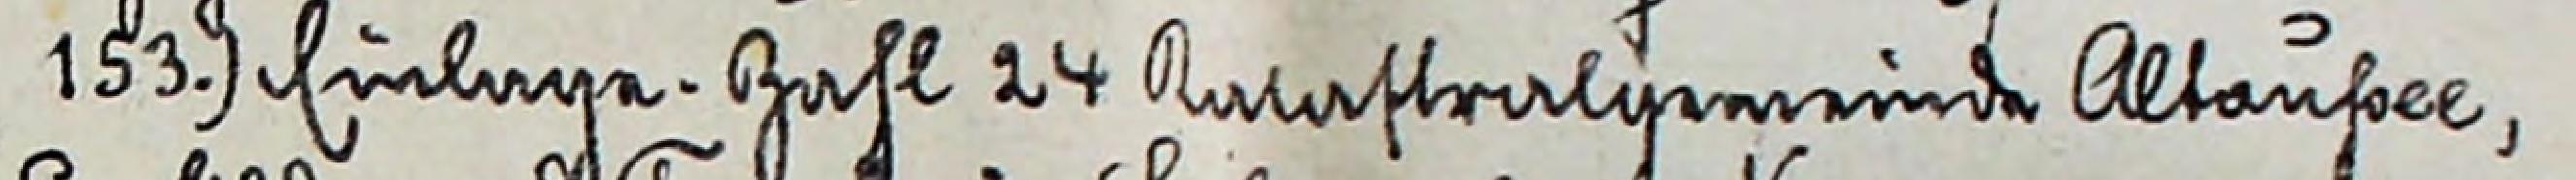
153.) Einlage - Zahl 24 Katastralgemeinde Altaussee,
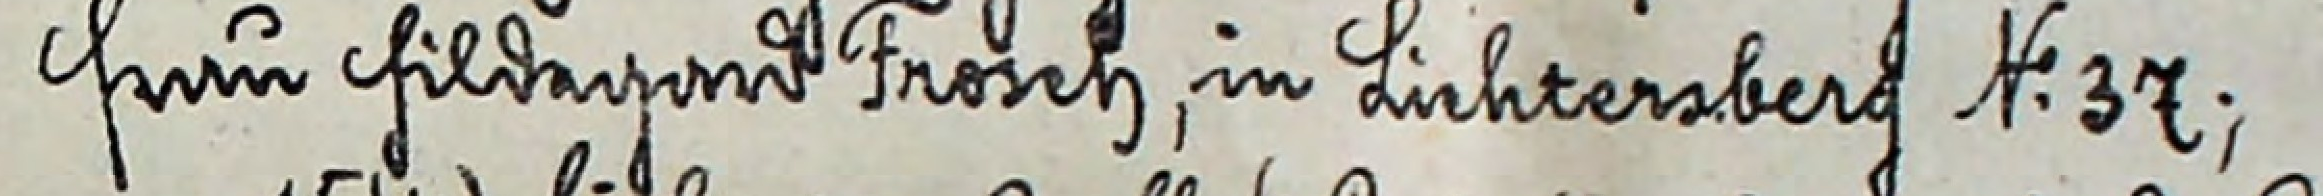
Frau Hildegard Frosch, in Lichtersberg № 37;
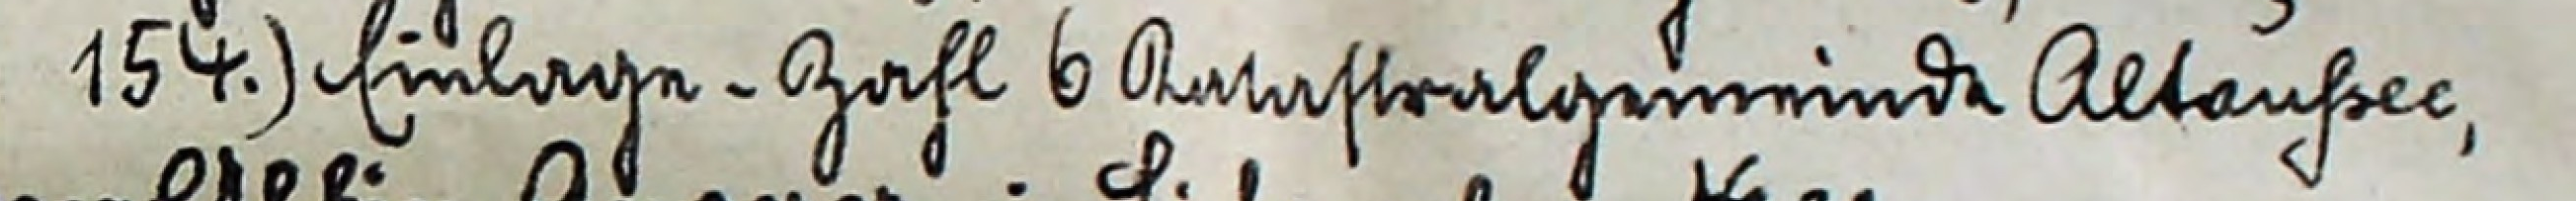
154.) Einlage - Zahl 6 Katastralgemeinde Altaussee,
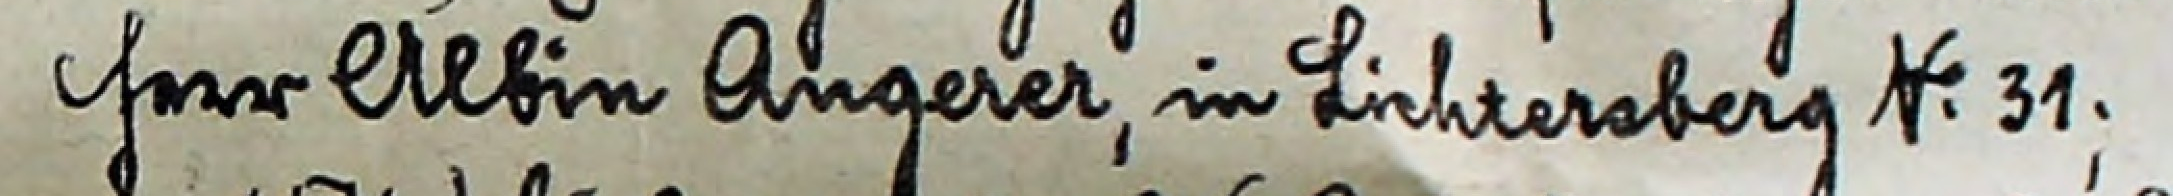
Herr Albin Angerer, in Lichtersberg № 31;
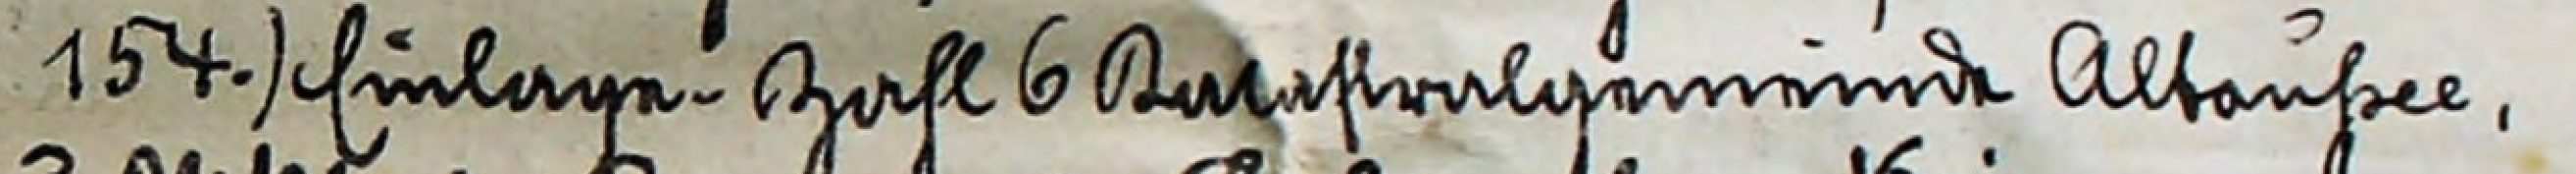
154.) Einlage - Zahl 6 Katastralgemeinde Altaussee,
